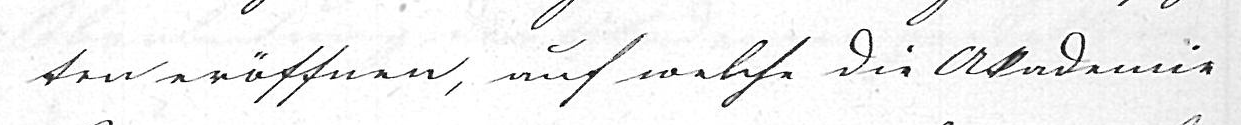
ten eröffnen, auf welche die Akademie
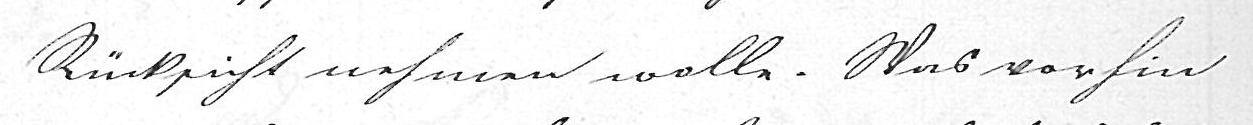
Rücksicht nehmen wolle. Was vorhin
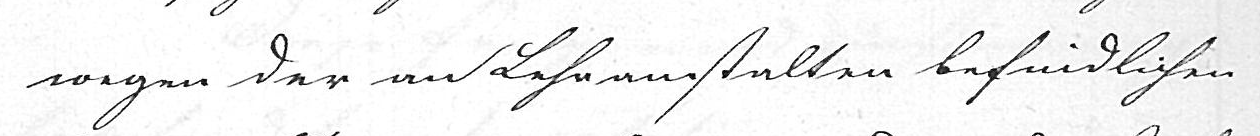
wegen der an Lehranstalten befindlichen
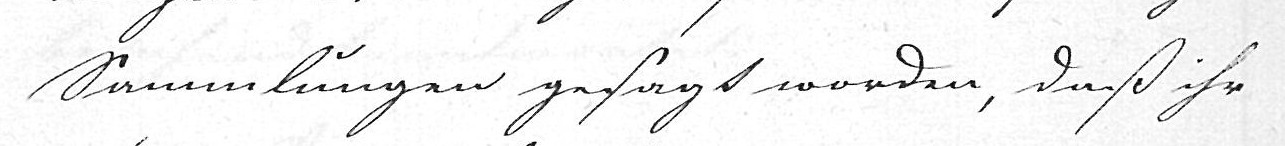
Sammlungen gesagt worden, daß ihr
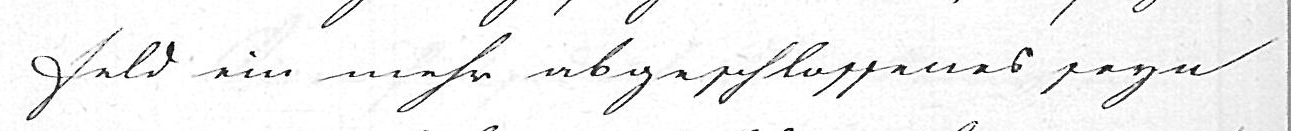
Feld ein mehr abgeschlossenes seyn
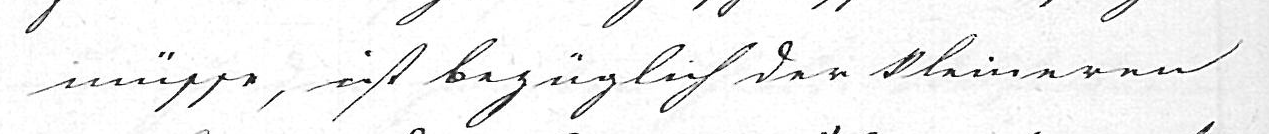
müsse, ist bezüglich der kleineren
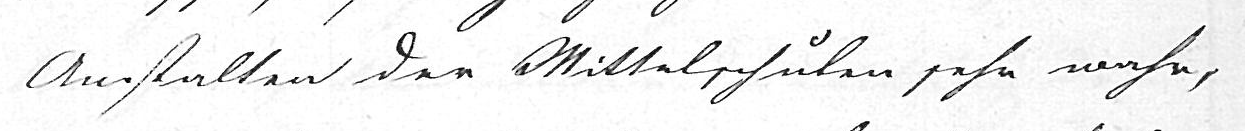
Anstalten der Mittelschulen sehr wahr,
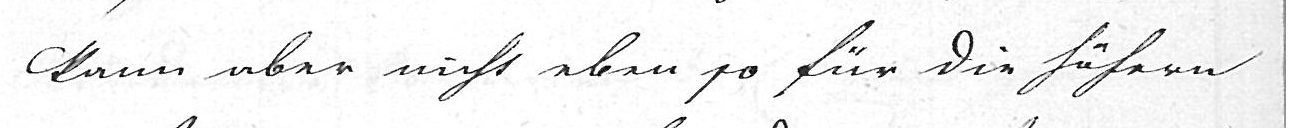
kann aber nicht eben so für die höhern
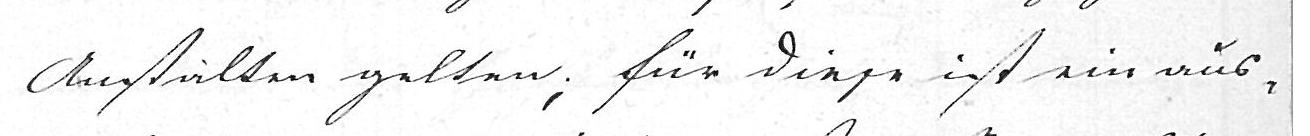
Anstalten gelten, für diese ist ein aus-
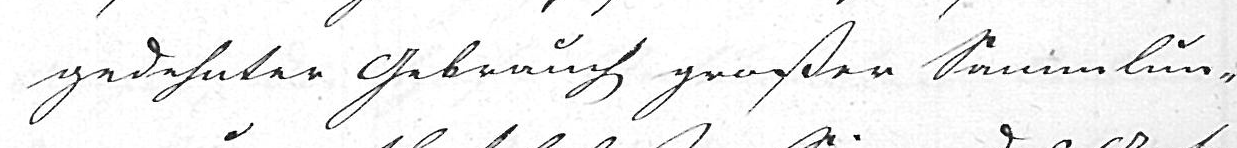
gedehnter Gebrauch großer Sammlun-
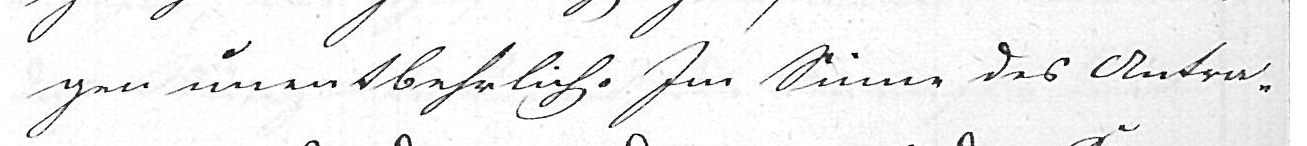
gen unentbehrlich. Im Sinne des Antra-
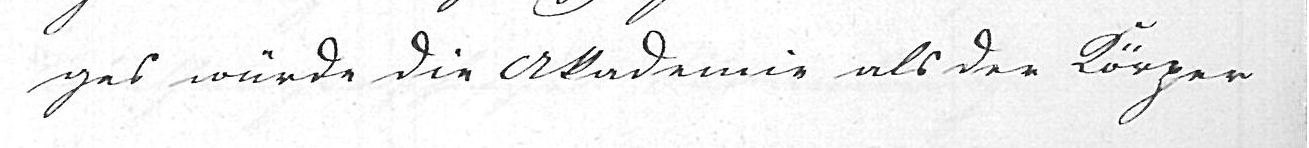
ges würde die Akademie als der Körper
